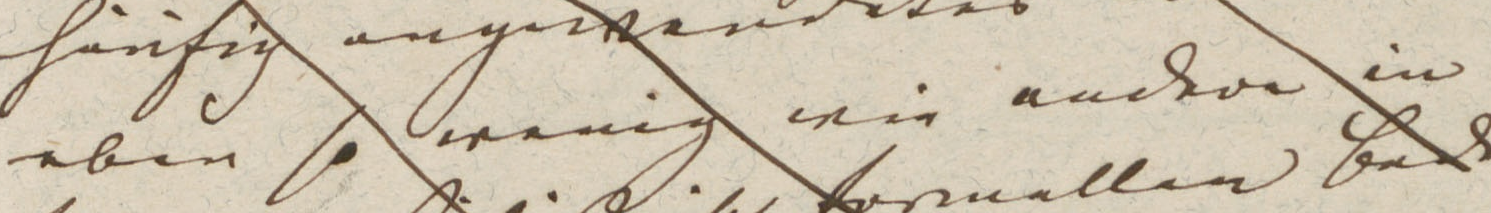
eben so wenig wie andere in
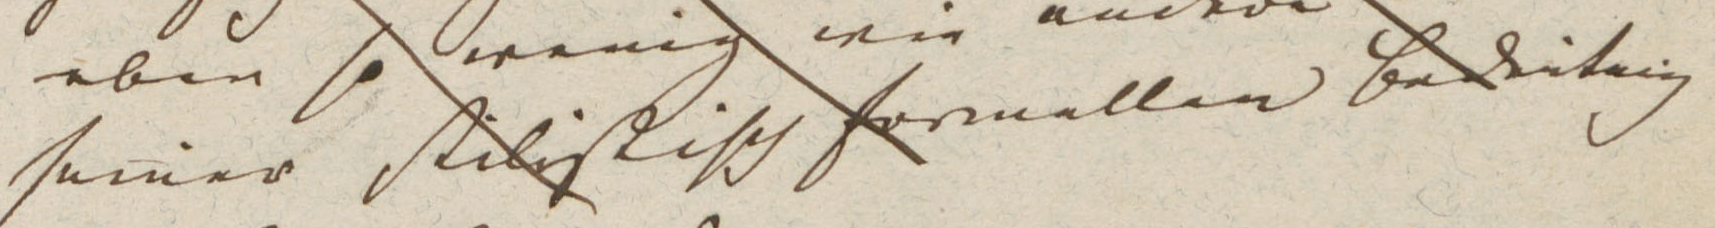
seiner stilistisch formellen Bedeutung
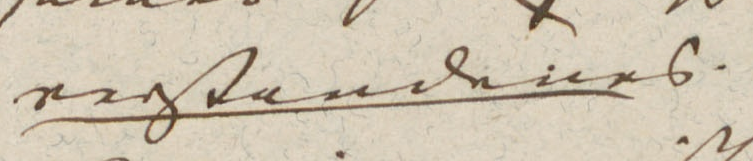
verstandenes.
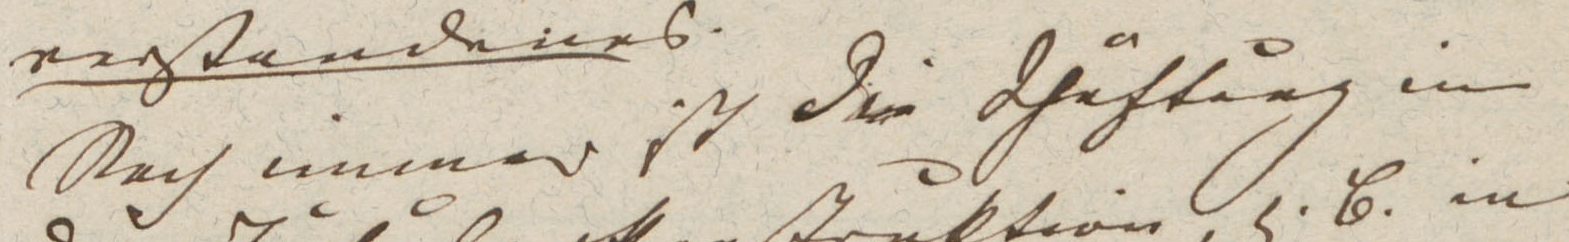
Noch immer ist die Schäftung in
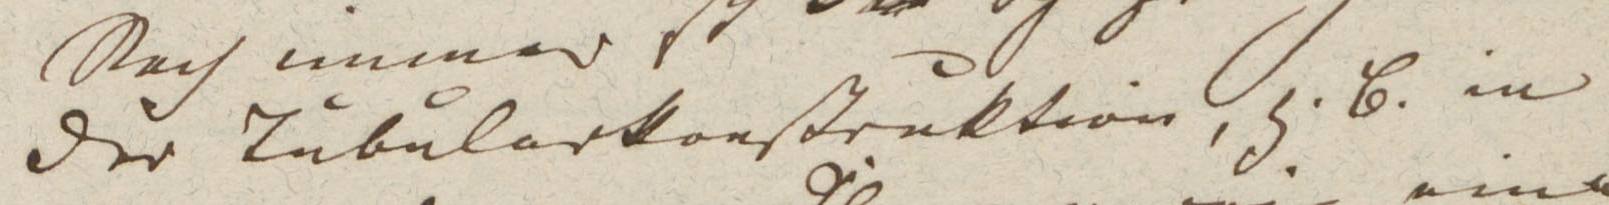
der Tubularkonstruktion, z. B. in
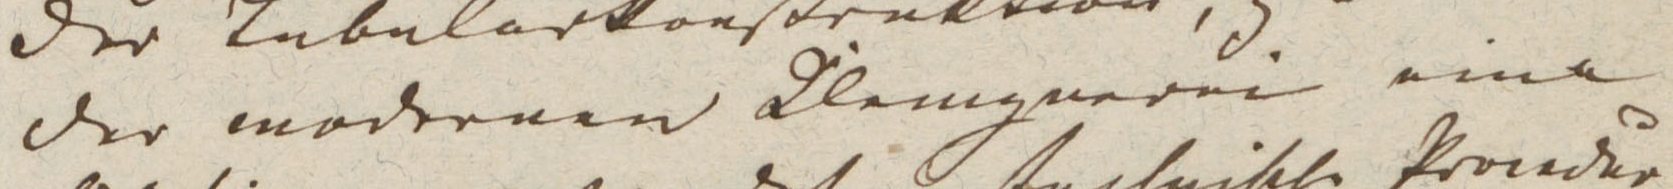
der modernen Klempnerei eine
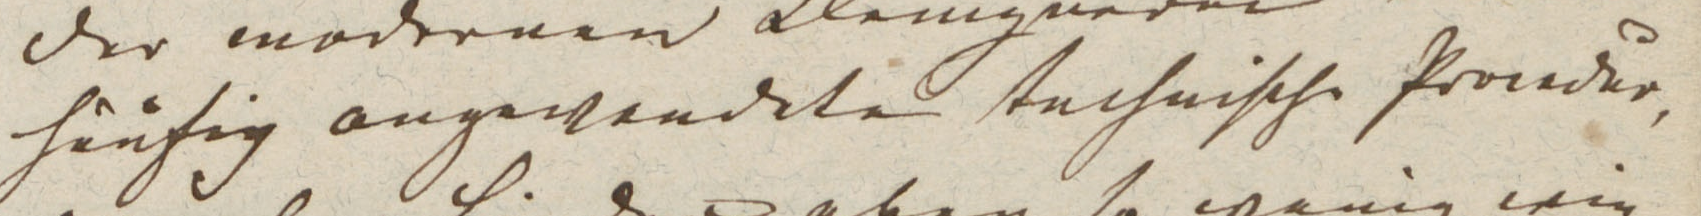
häufig angewendete technische Procedur,
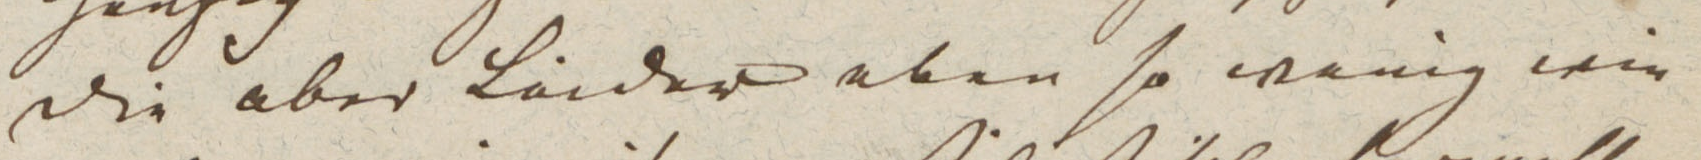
die aber Leider eben so wenig wie
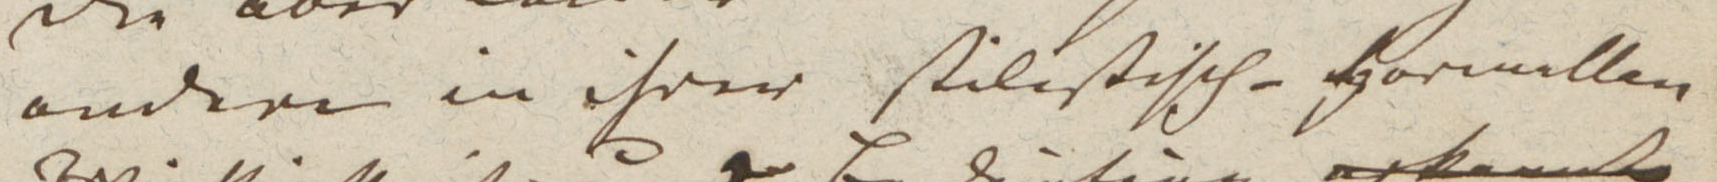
andere in ihrer stilistisch-formellen
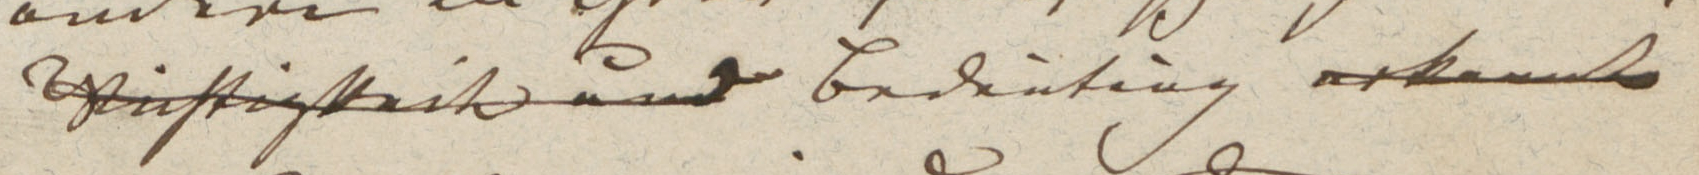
Wichtigkeit und Bedeutung erkannt
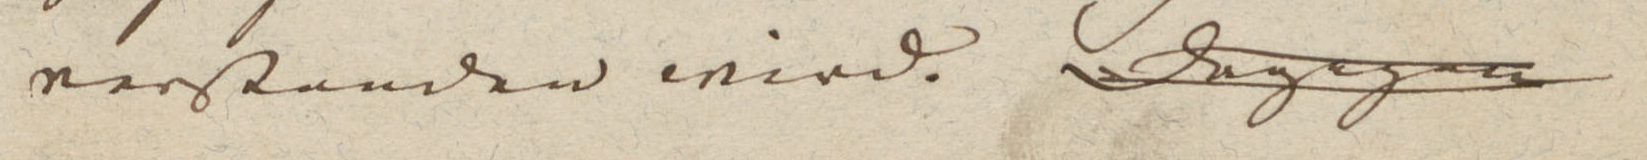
verstanden wird. Dagegen
